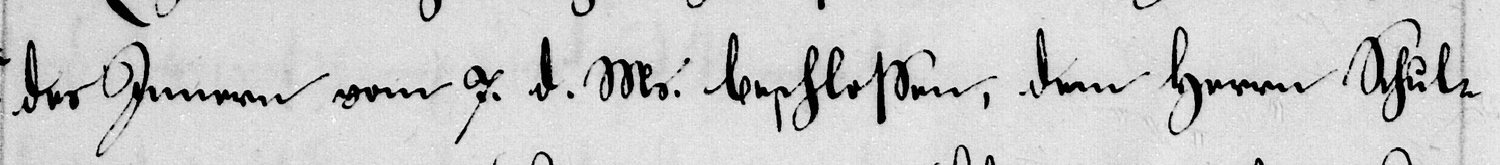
des Innern vom 7. d. Ms. beschloßen, dem Herrn Schul¬
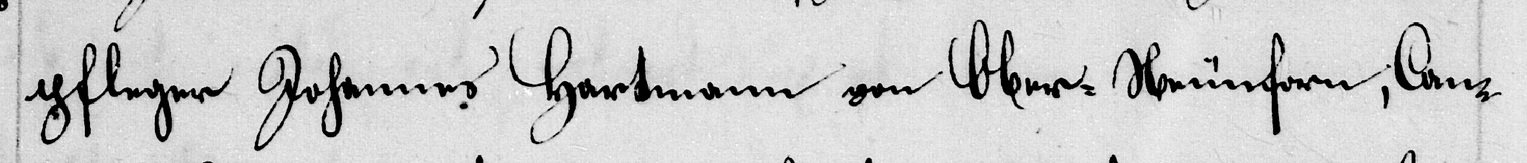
pfleger Johannes Hartmann von Ober-Neunforn, Can¬
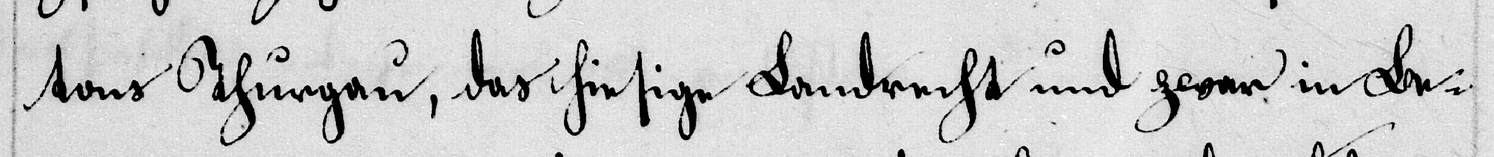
tons Thurgau, das hiesige Landrecht und zwar in Be¬
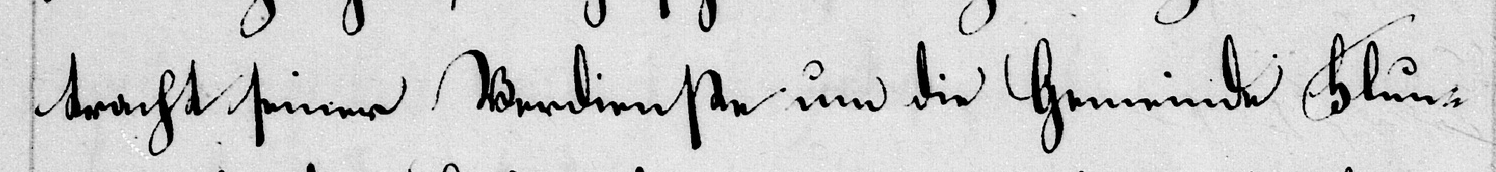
tracht seiner Verdienste um die Gemeinde Flun¬
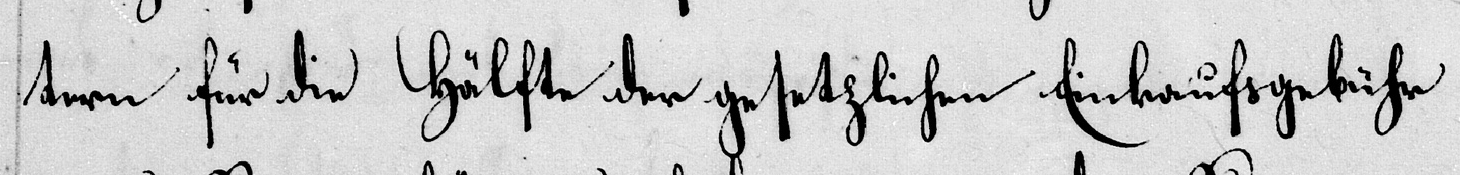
tern für die Hälfte der gesetzlichen Einkaufsgebühr
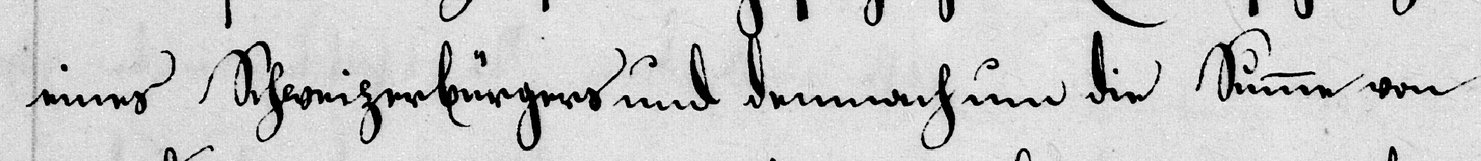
eines Schweizerbürgers und demnach um die Summe von
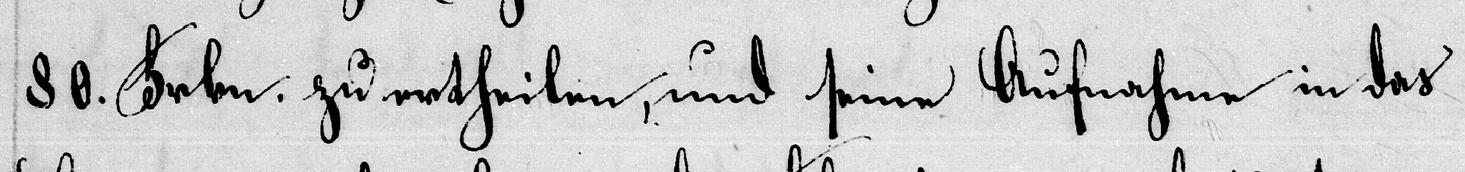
80. Frkn. zu ertheilen, und seine Aufnahme in das
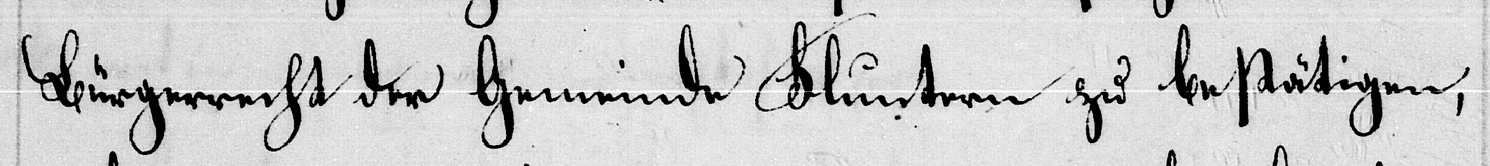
Bürgerrecht der Gemeinde Fluntern zu bestätigen,
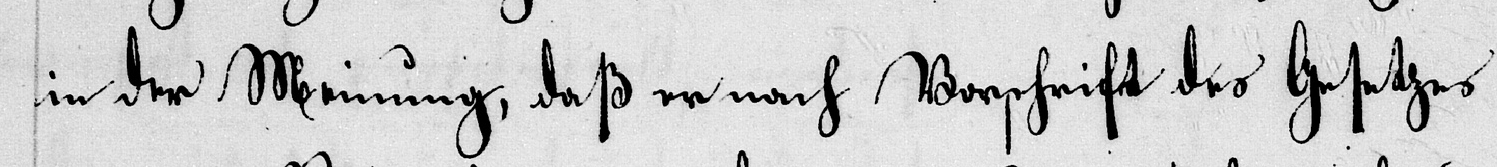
in der Meinung, daß er nach Vorschrift des Gesetzes
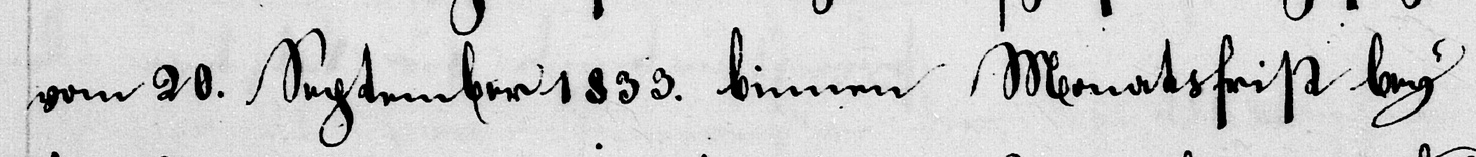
vom 20. September 1833. binnen Monatsfrist bey
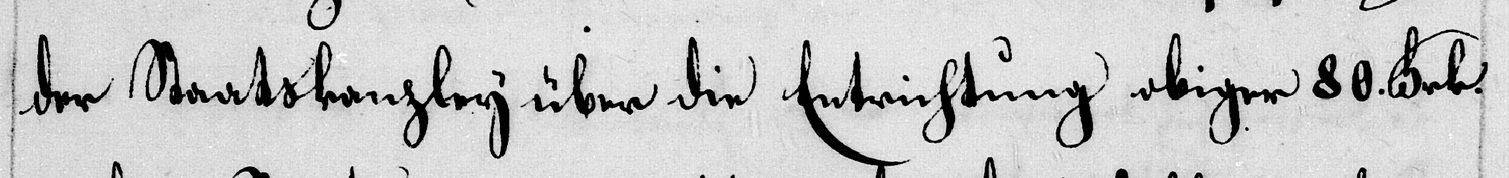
der Staatskanzley über die Entrichtung obiger 80. Frk.
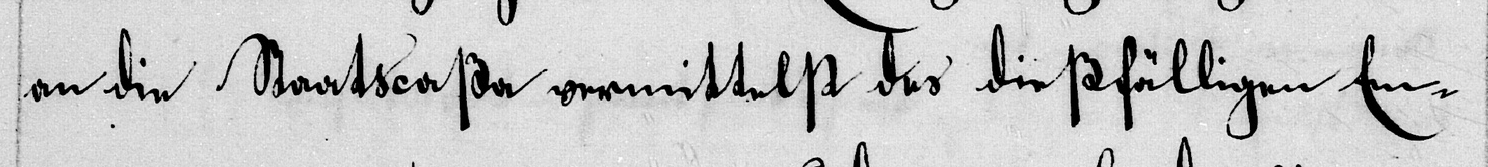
an die Staatscaßa vermittelst des dießfälligen Em¬
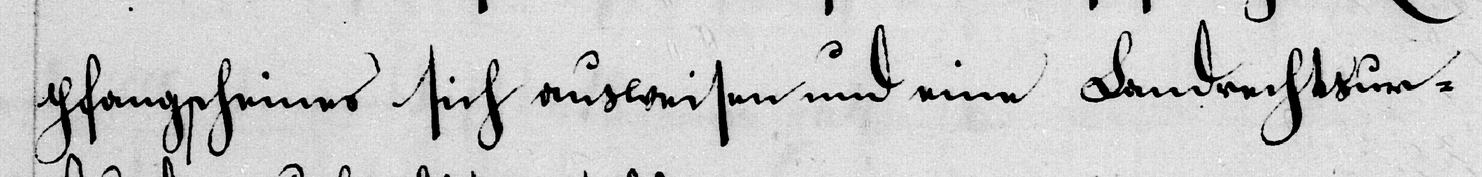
pfangsscheines sich ausweisen und eine Landrechtsur¬
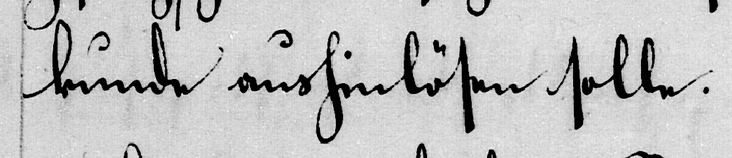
kunde aushinlösen solle.
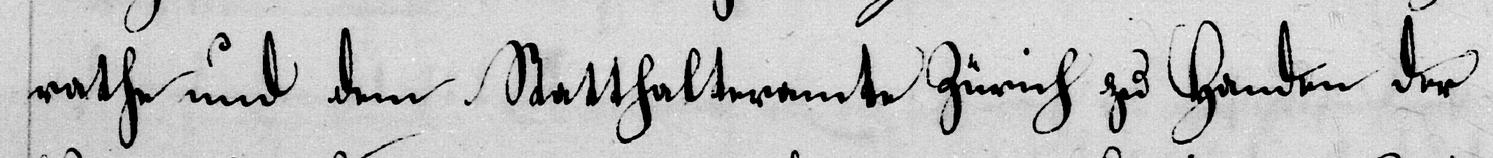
rathe und dem Statthalteramte Zürich zu Handen der
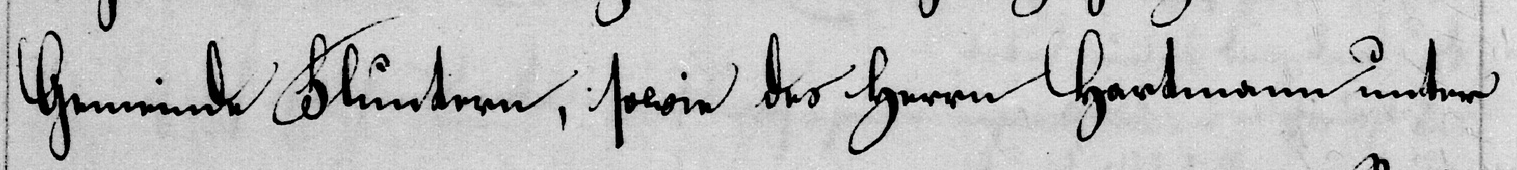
Gemeinde Fluntern, sowie des Herrn Hartmann unter
